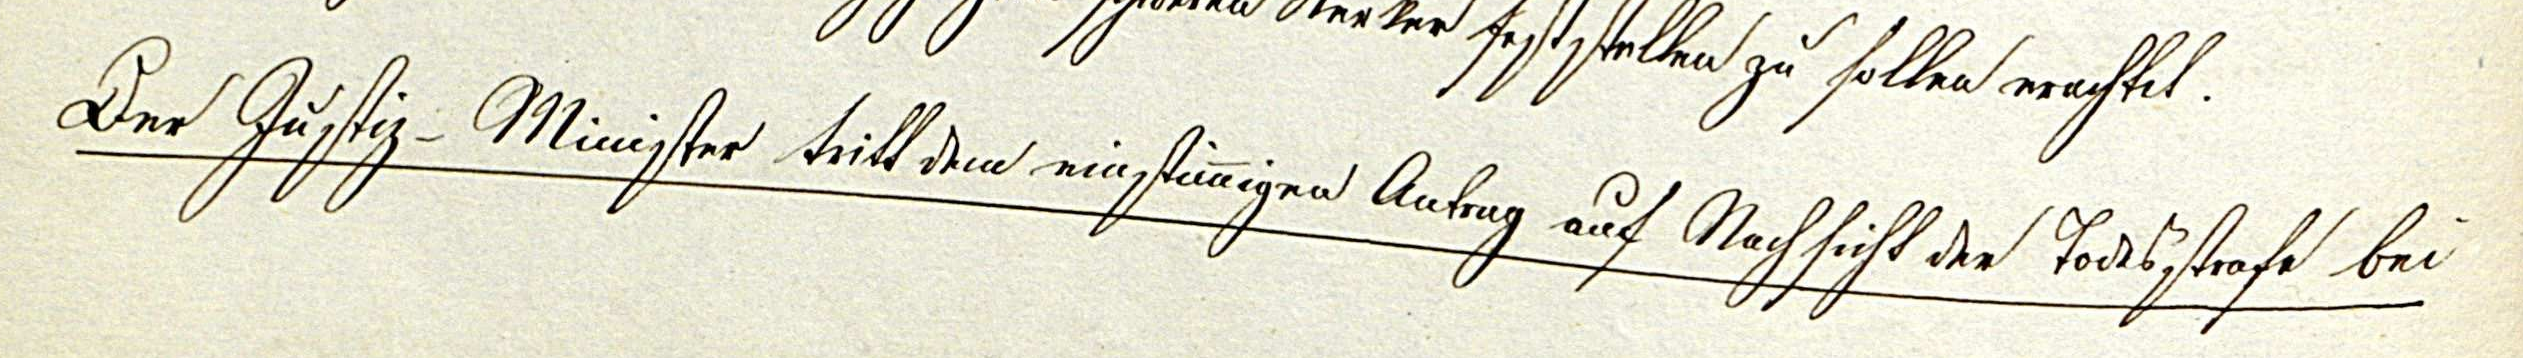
Der Justiz-Minister tritt dem einstimmigen Antrag auf Nachsicht der Todesstrafe bei
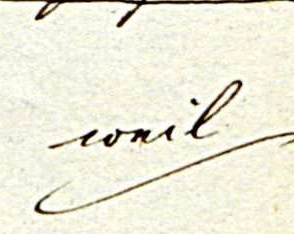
weil
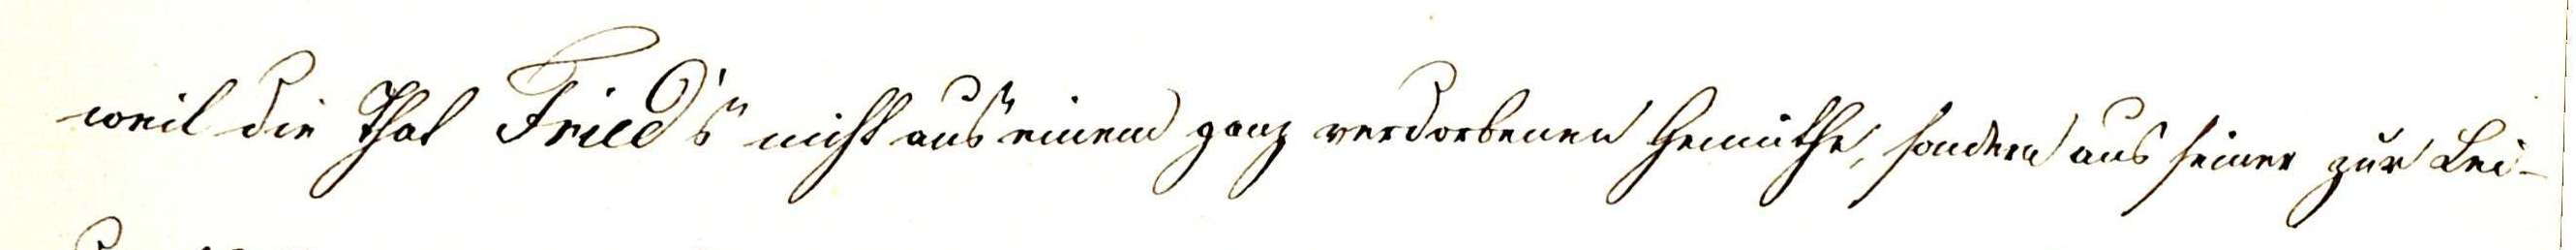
weil die That Fried’s nicht aus einem ganz verdorbenen Germüthe, sondern aus seiner zur Lei¬
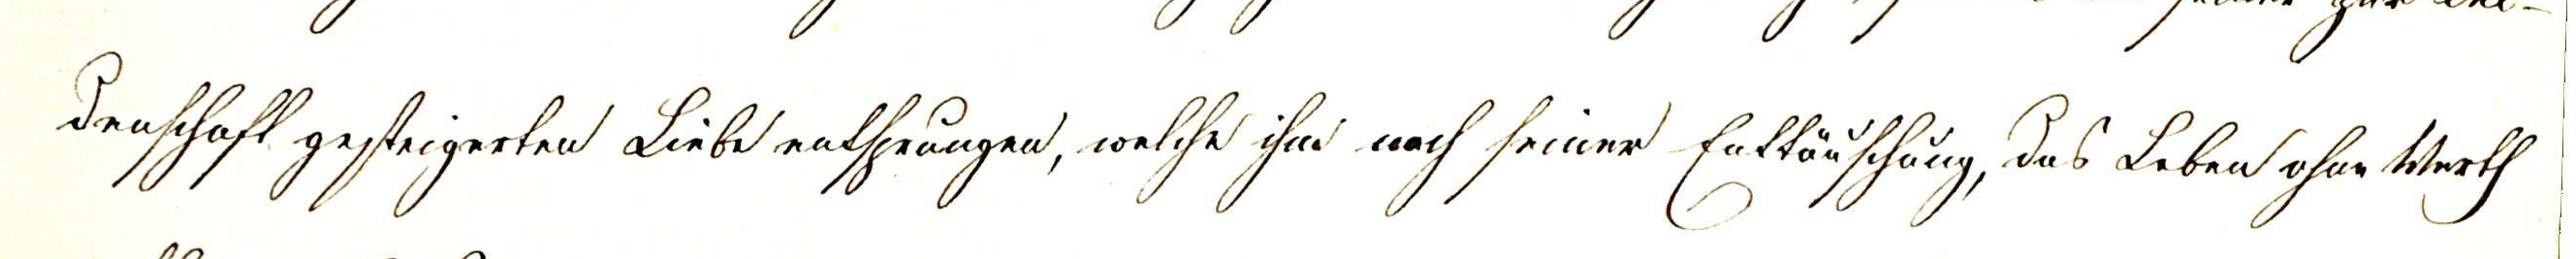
denschaft gesteigerten Liebe entsprungen, welche ihm nach seiner Enttäuschung, das Leben ohne Werth
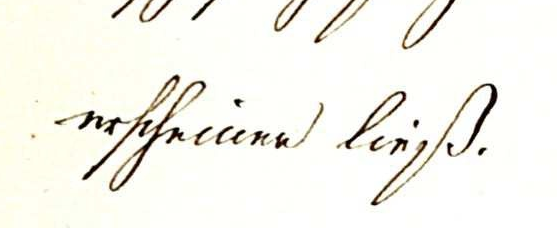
erscheinen ließ.
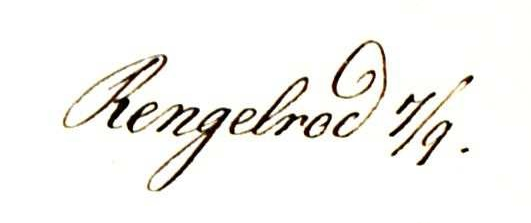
Rengelrod 7/9
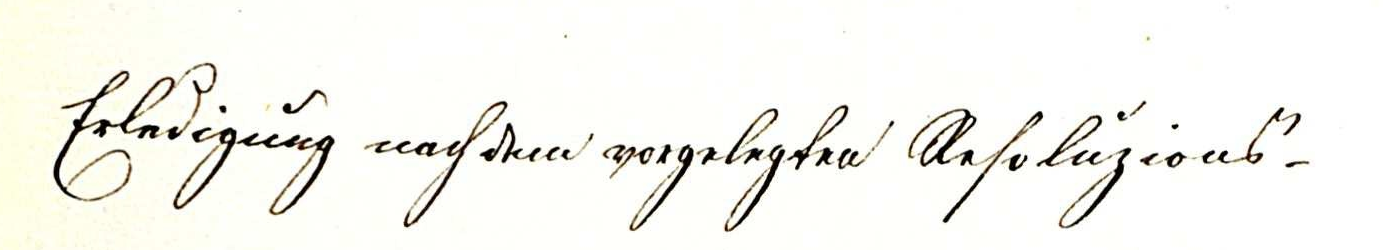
Erledigung nach dem vorgelegten Resolutions
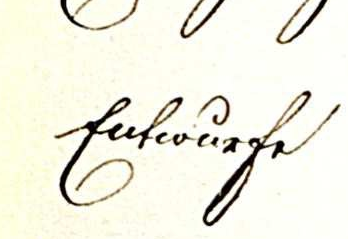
Entwurfe
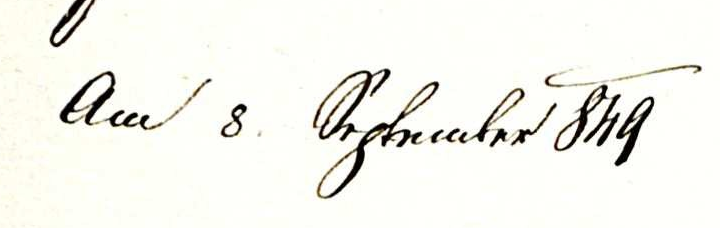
Am 8. September 849
